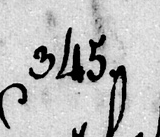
4.)
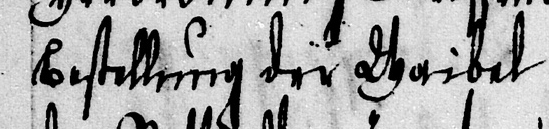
Bestellung der Waibel
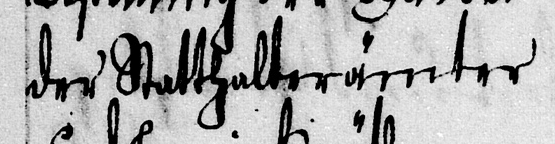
der Statthalterämter
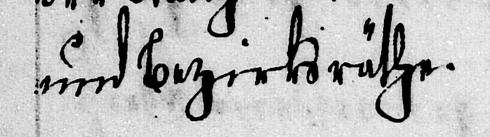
und Bezirksräthe:
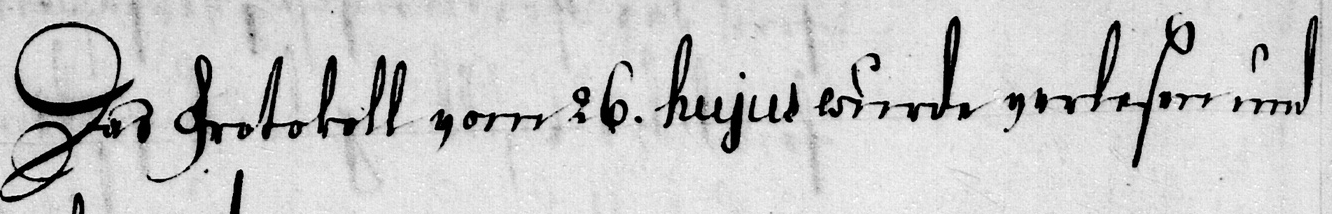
Das Protokoll vom 26. hujus wurde verlesen und
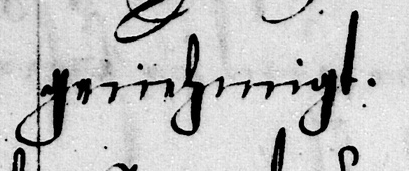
genehmigt.
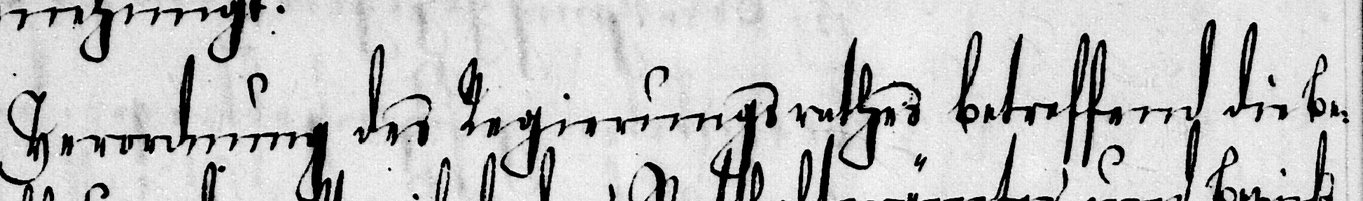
Verordnung des Regierungsrathes betreffend die
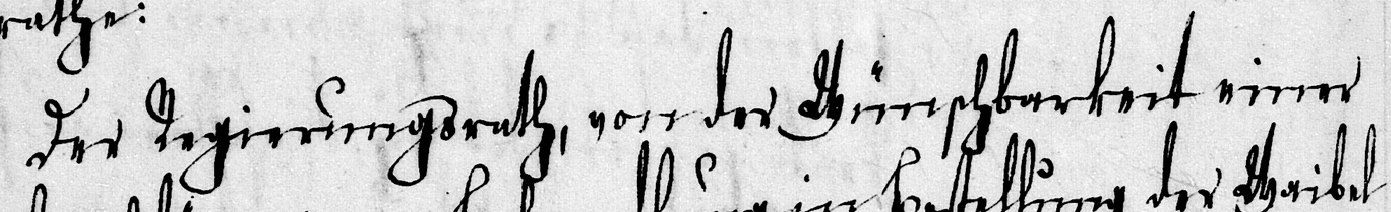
Der Regierungsrath, von der Wünschbarkeit einer
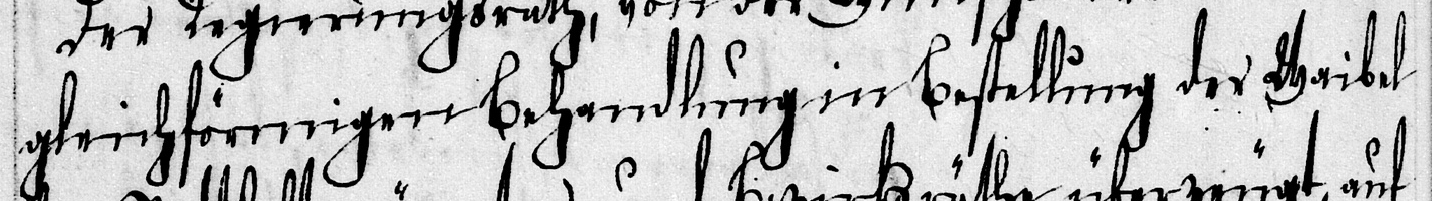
gleichförmigen Behandlung in Bestellung der Waibel
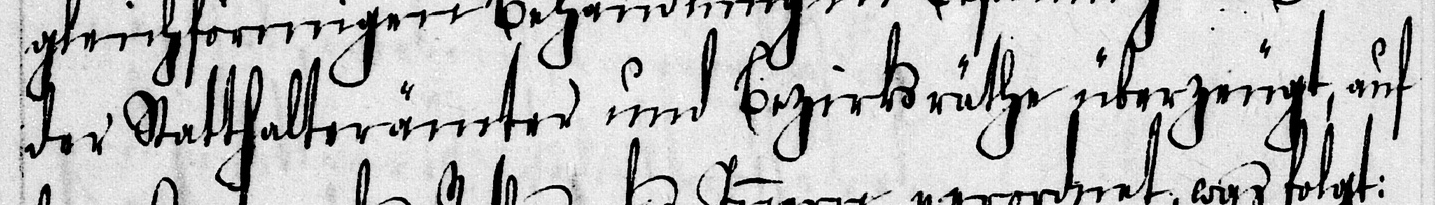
der Statthalterämter und Bezirksräthe überzeugt, auf
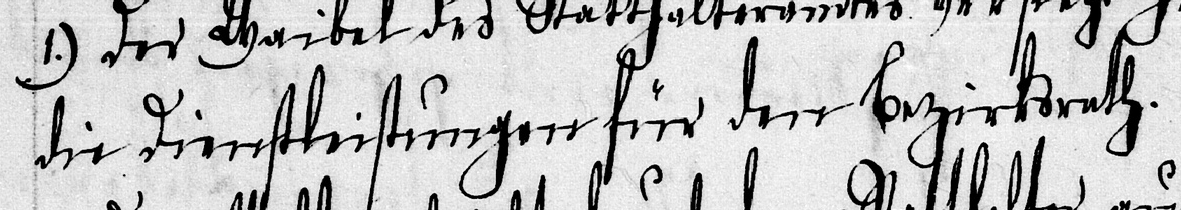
die Dienstleistungen für den Bezirksrath.
